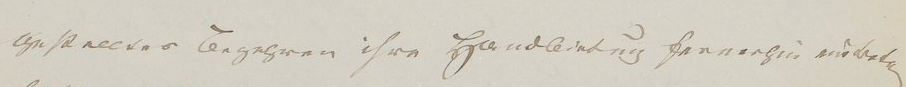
gestelltes Begehren ihre Handbietung fernerhin wirken
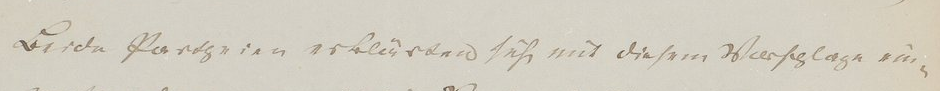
Beide Partheien erklärten sich mit diesem Vorschlage ein-
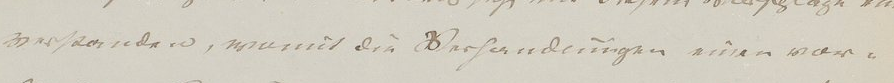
verstanden, womit die Verhandlungen einen vor-
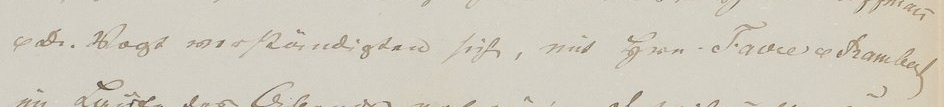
u. Dr. Vogt verständigten sich, mit Hrn. Favre u. Kaufmann
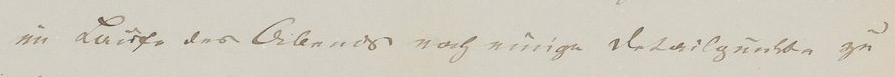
im Laufe des Abends noch einige Detailpunkte zu
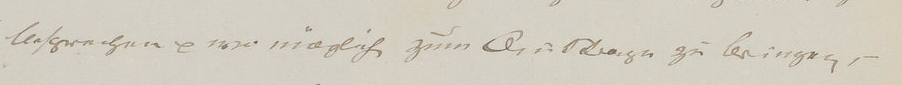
besprechen u. wo möglich zum Austrage zu bringen,
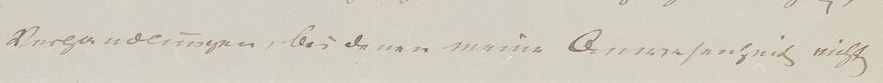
Verhandlungen, bei denen meine Anwesenheit nicht
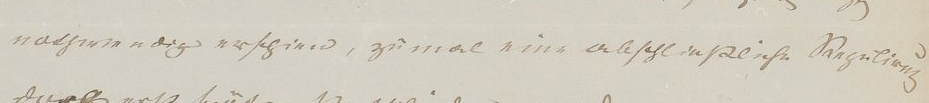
nothwendig erschien, zumal eine abschließliche Regelung
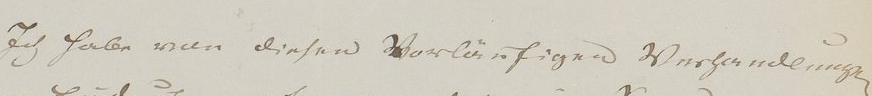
Ich habe von diesen vorläufigen Verhandlungen
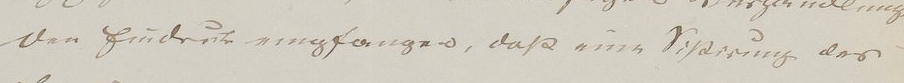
den Eindruck empfangen, daß eine Sistirung des
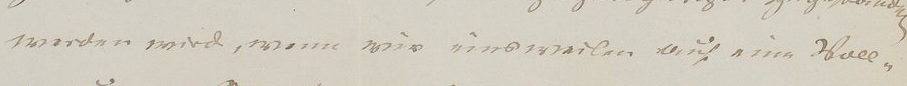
werden wird, wenn wir einsweilen auf eine Voll-
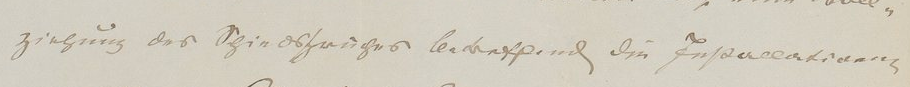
ziehung des Schiedsspruches betreffend die Installationen
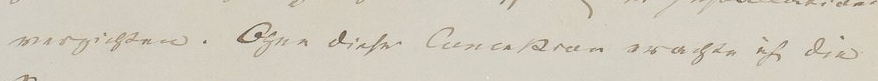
verzichten. Ohne diese Conceßion erachte ich die
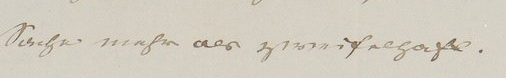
Sache mehr als zweifelhaft.
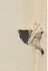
auch
